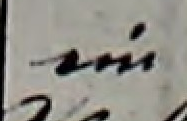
ein
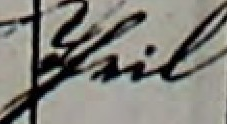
Theil
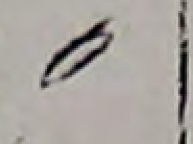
6
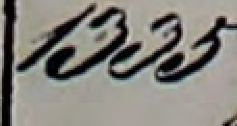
1335
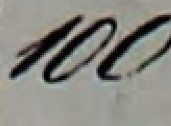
100
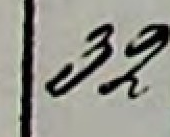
32
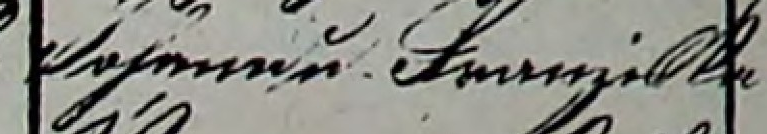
Johann u. Franziska
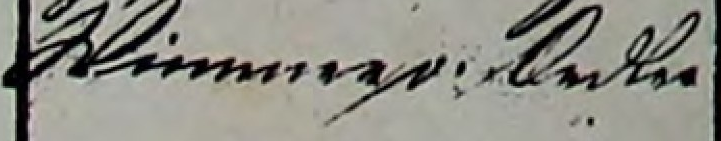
Wimmer v. Oedler
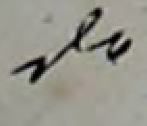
do
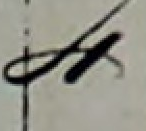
4
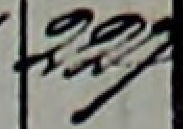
227
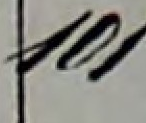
101
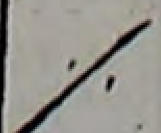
./.
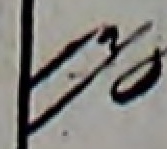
178
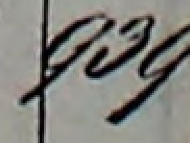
939
